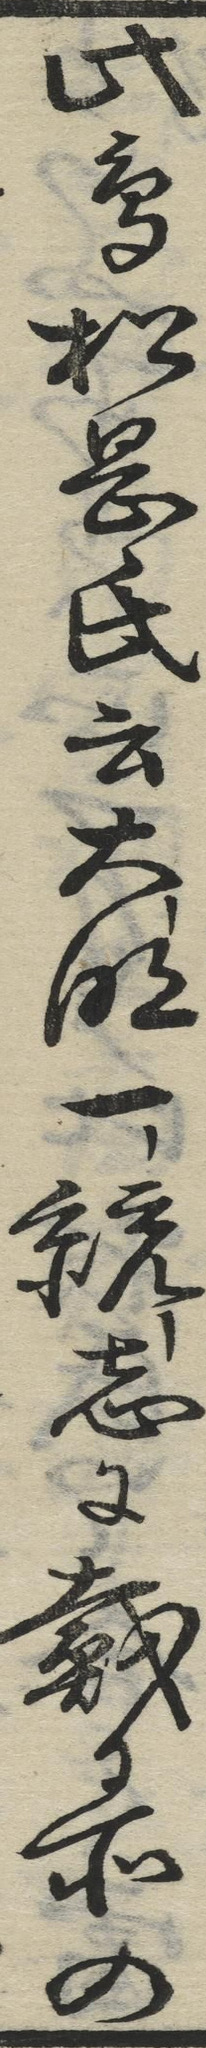此鳥松岡氏云大明一統志に載る所の
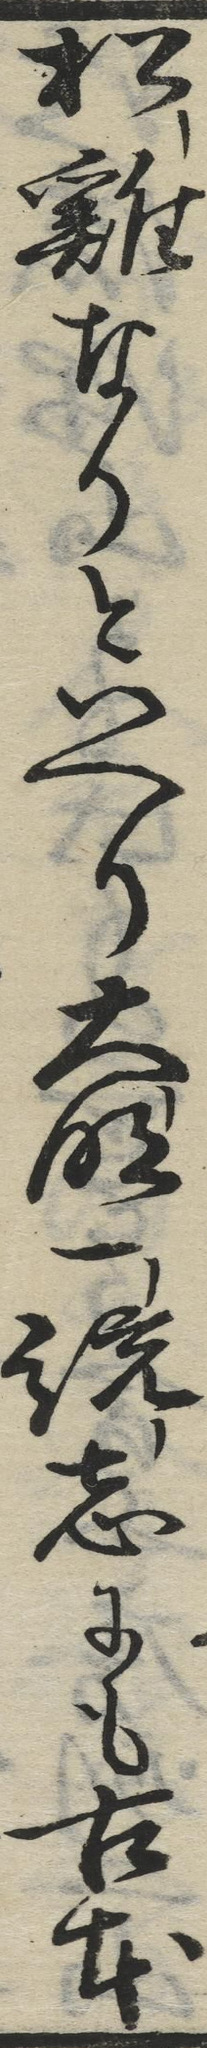松雞なりといへり大明一統志にも古本
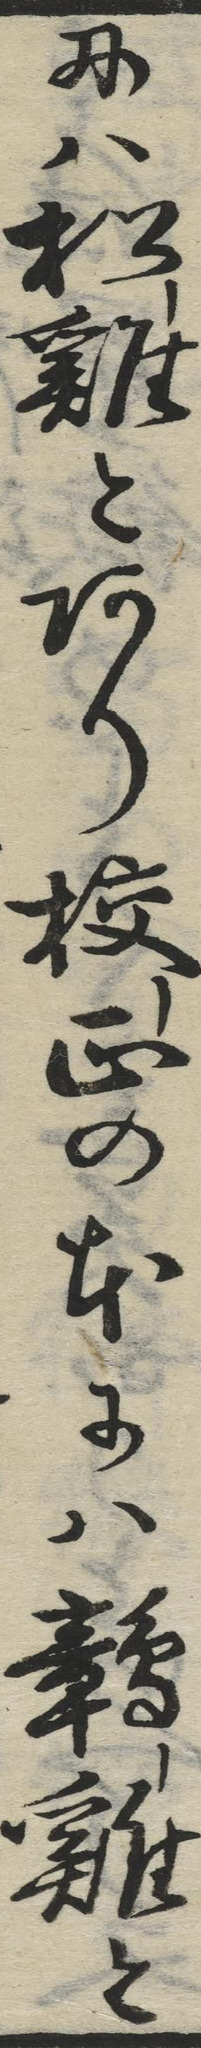にハ松雞とあり校正の本にハ𪅂雞と
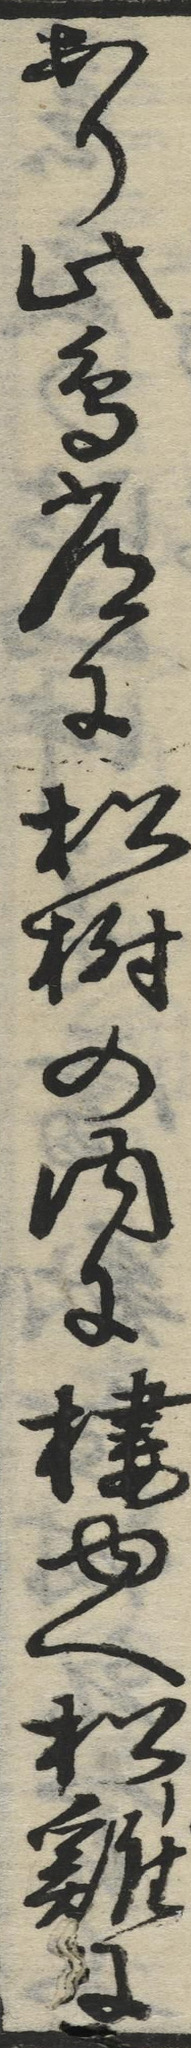あり此鳥常に松柎の内に棲ゆへ松雞に
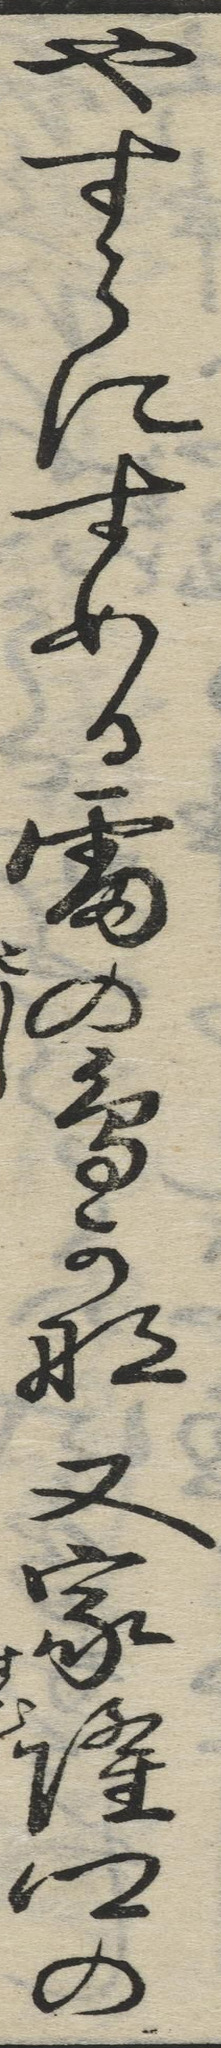やすらにすめる雷の鳥かな又家隆卿の
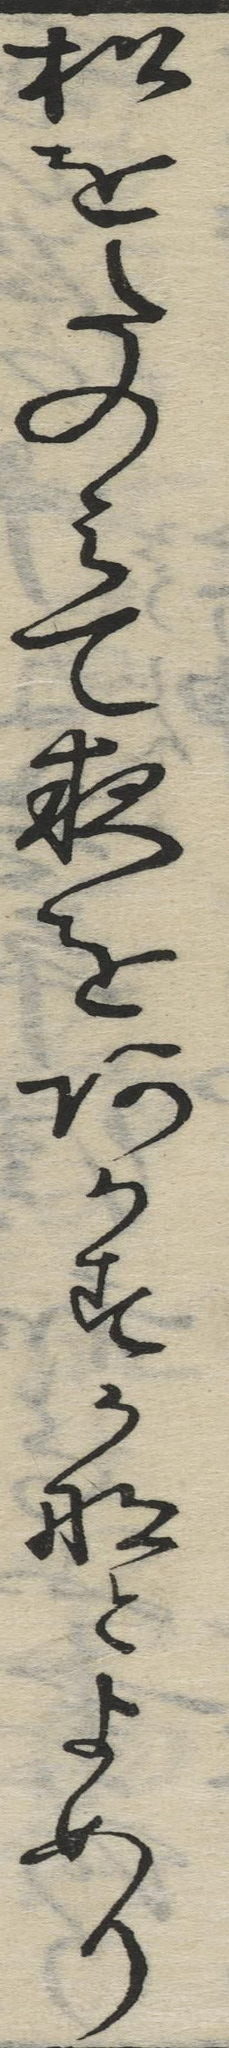松をたのミて夜をあかすかなとよめり
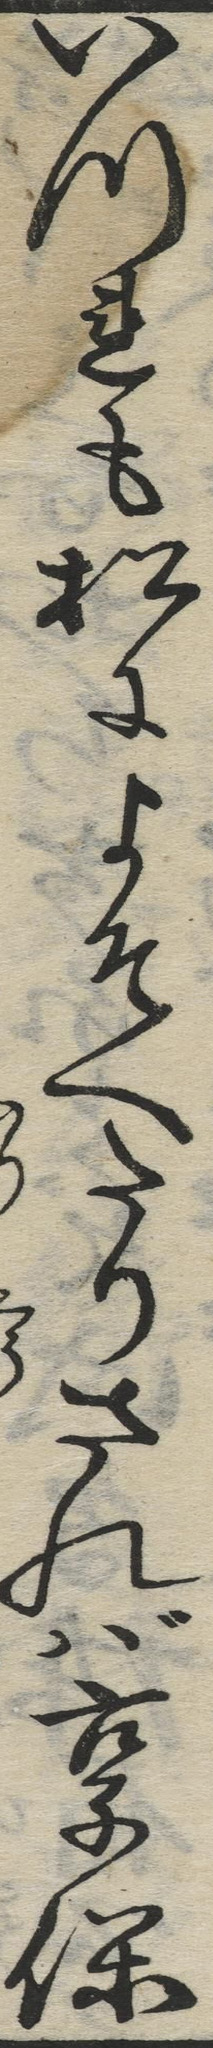いつれも松によそへたりされバ享保
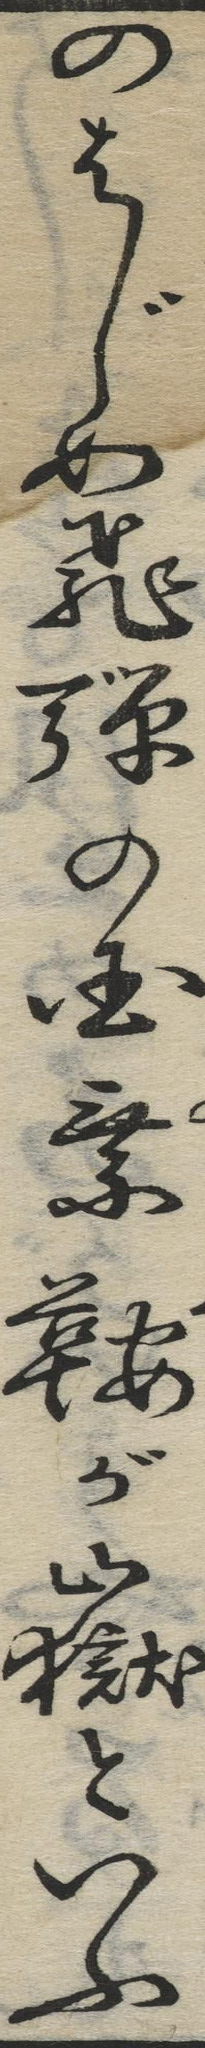のはじめ飛騨の国乗鞍が嶽といふ
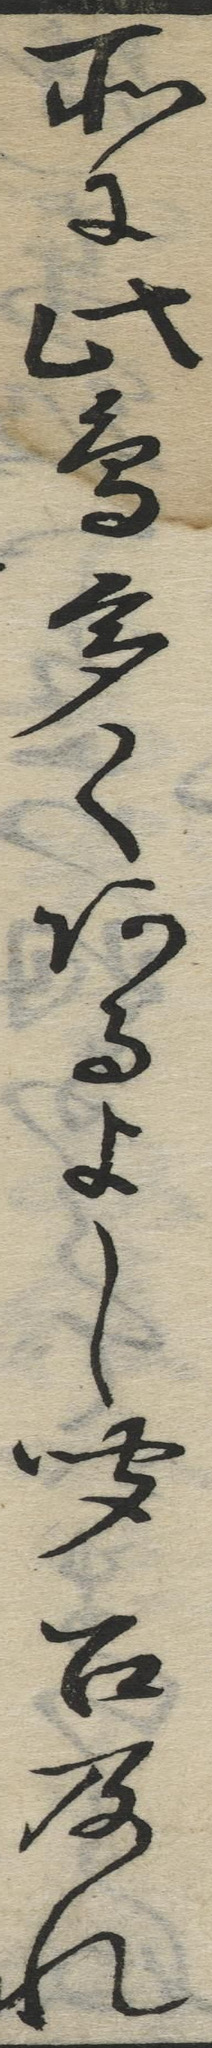所に此鳥多くあるよし聞召及れ
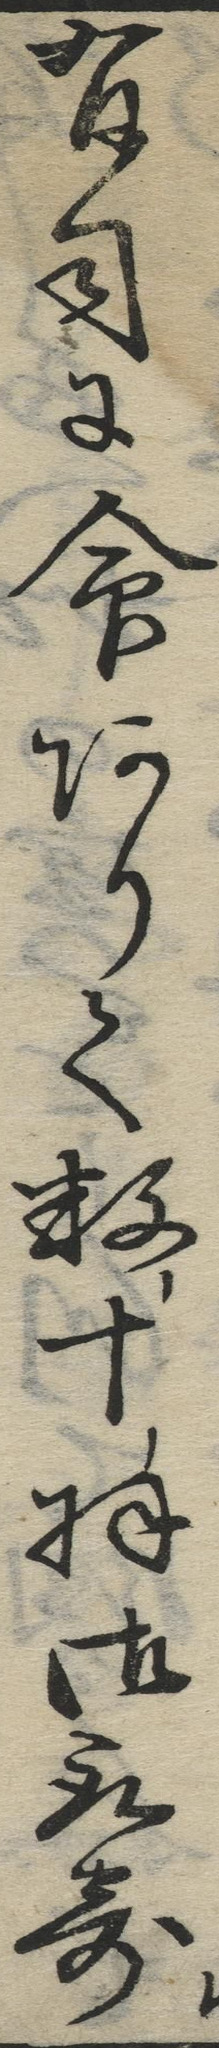有司に命ありて数十羽御取寄
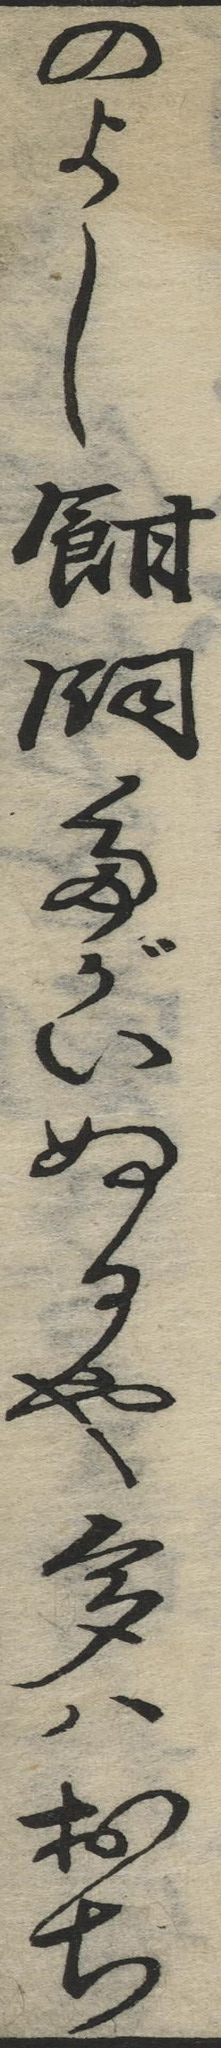のよし餌飼たがいぬるや多ハおち

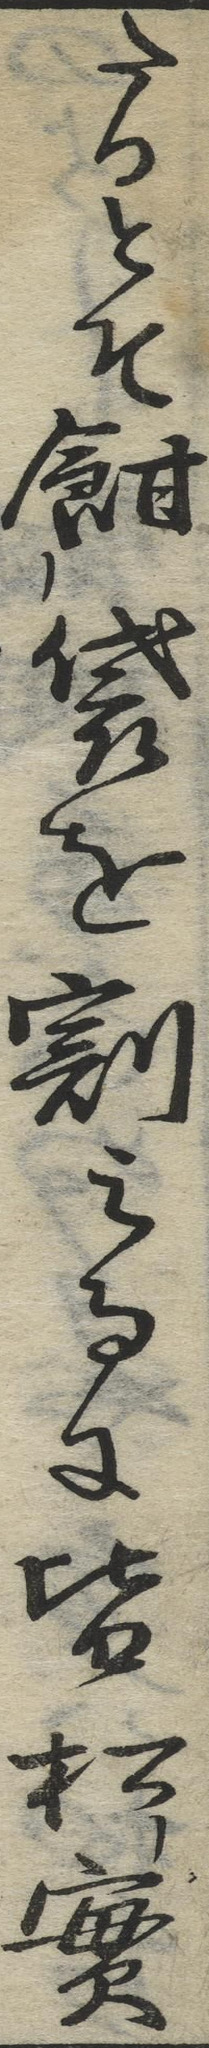たるとそ餌袋を割之事に皆松ノ実
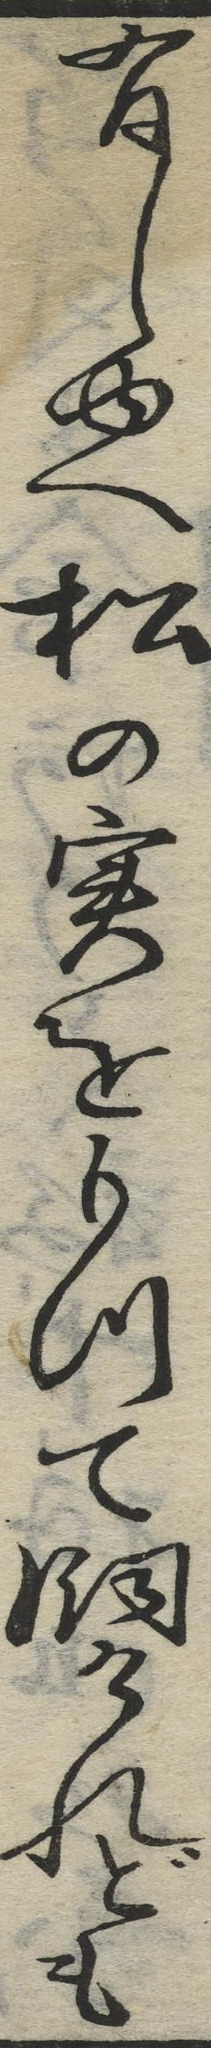有之ゆへ松の実をとつて飼けれども
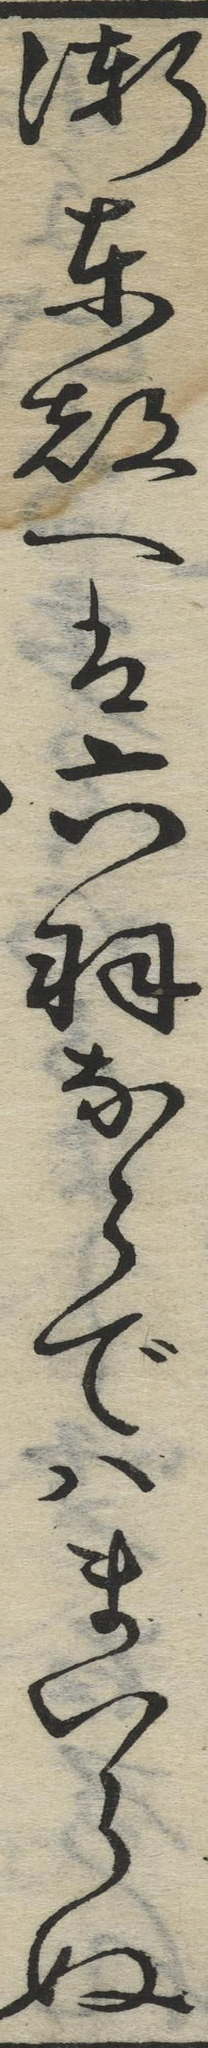漸東都へは六羽ならでハまいらぬ
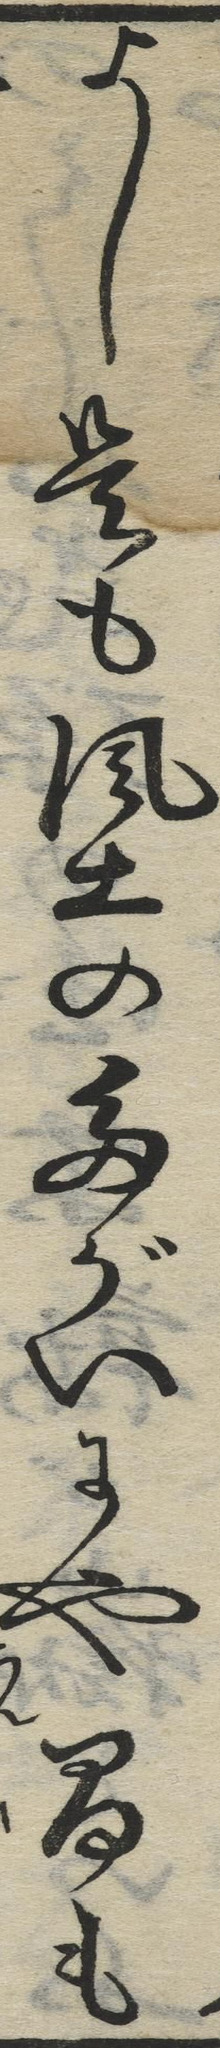よし是も風土のたがいにや間も
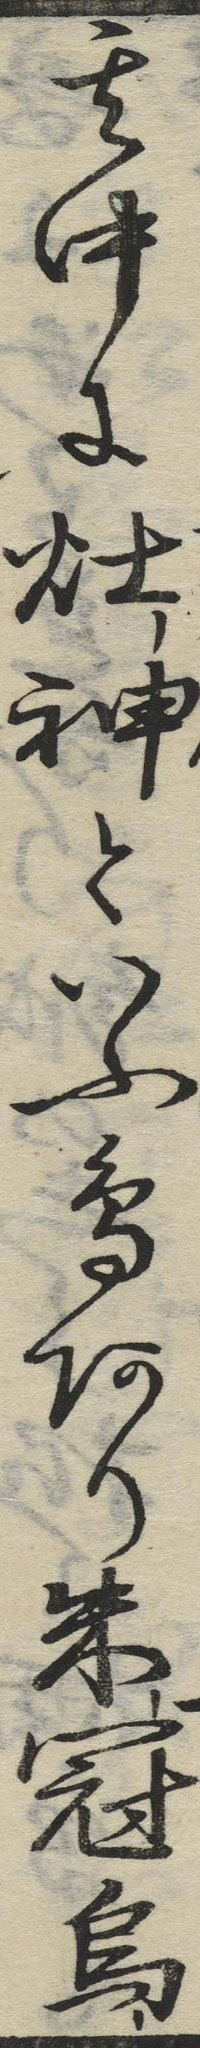其中に灶神といふ鳥あり朱冠鳥
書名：雷震記　完
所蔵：東京大学地震研究所図書室 Earthquake Research Institute Library, The University of Tokyo, JAPAN
